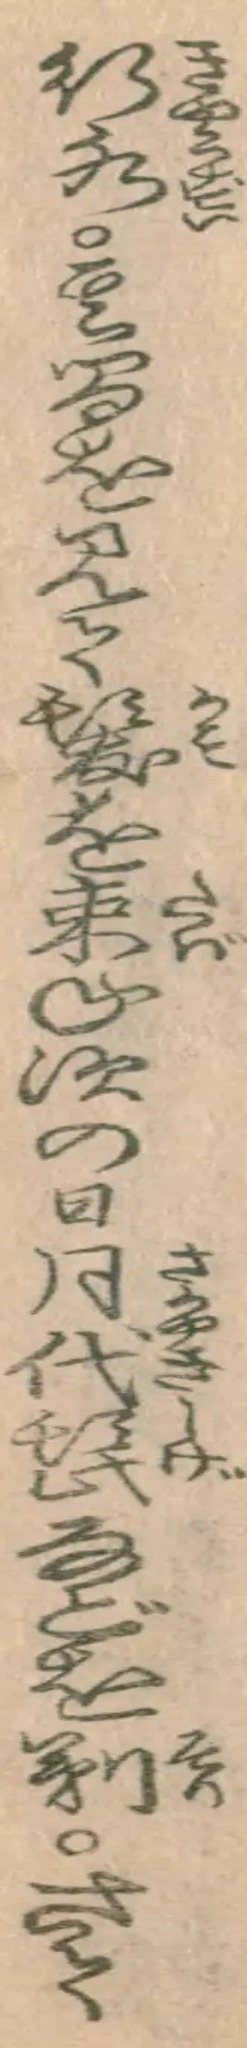行水○其間を見て髪を束ね次の日月代髭などを剃○さて
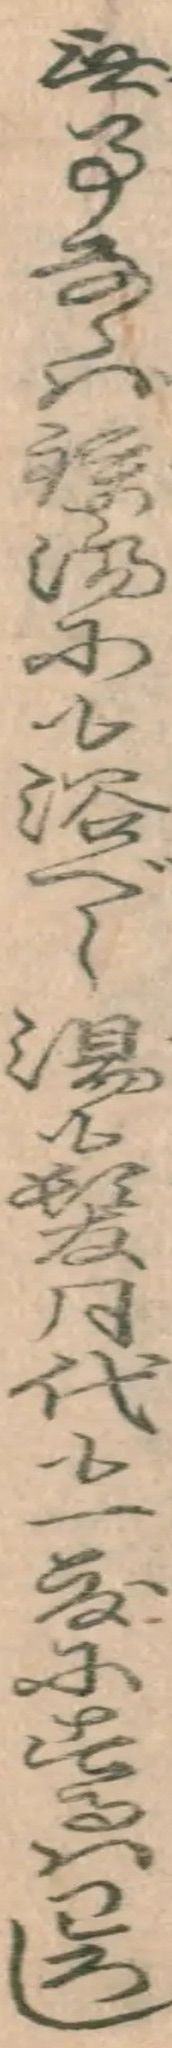無事ならば銭湯にも浴べし湯も髪月代も一度にするはわろし
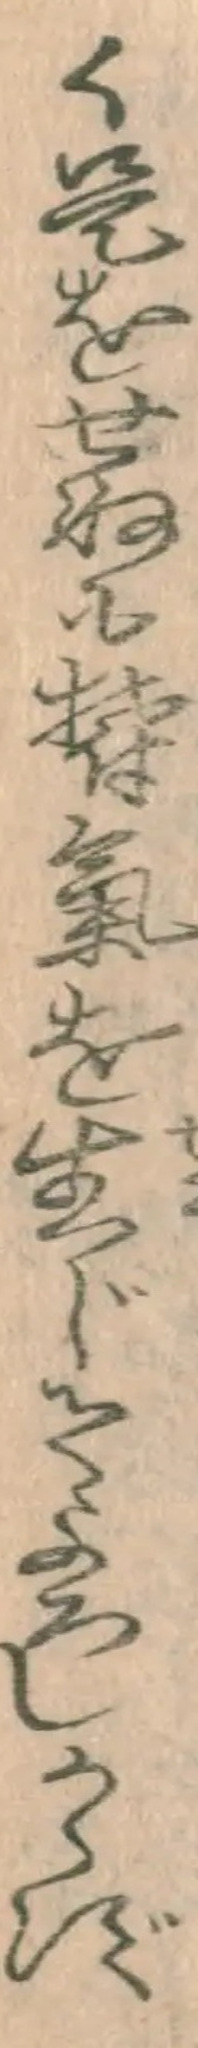く是をせぬも欝気を生じてよろしからず
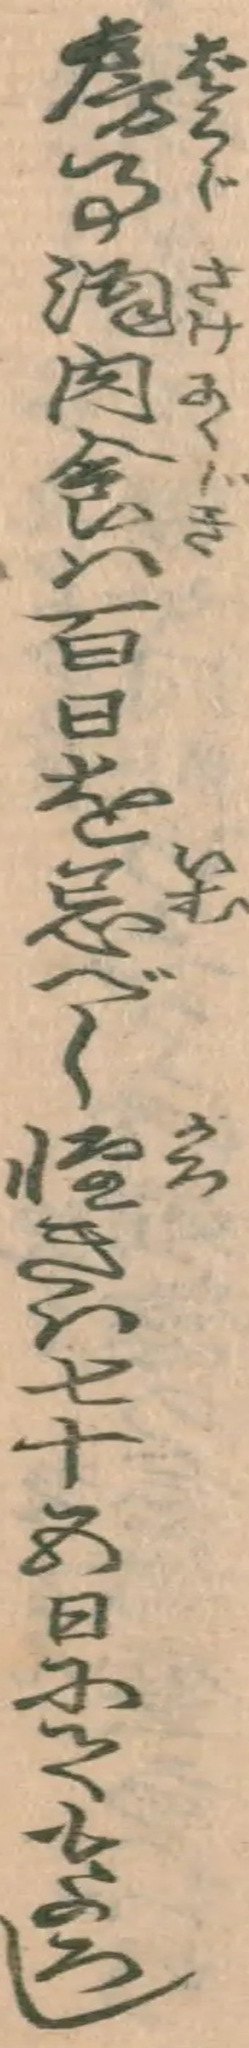房事酒肉食は百日を忌べし軽きは七十五日にてもよろし
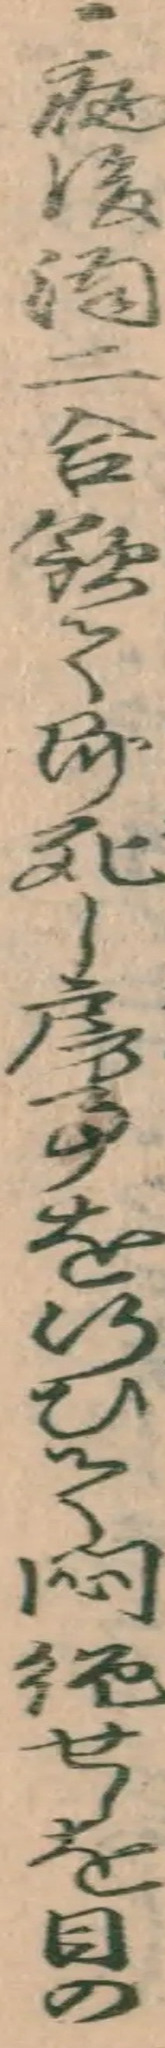・病後酒二合飲て即死し房事を行ひて悶絶せしを目の
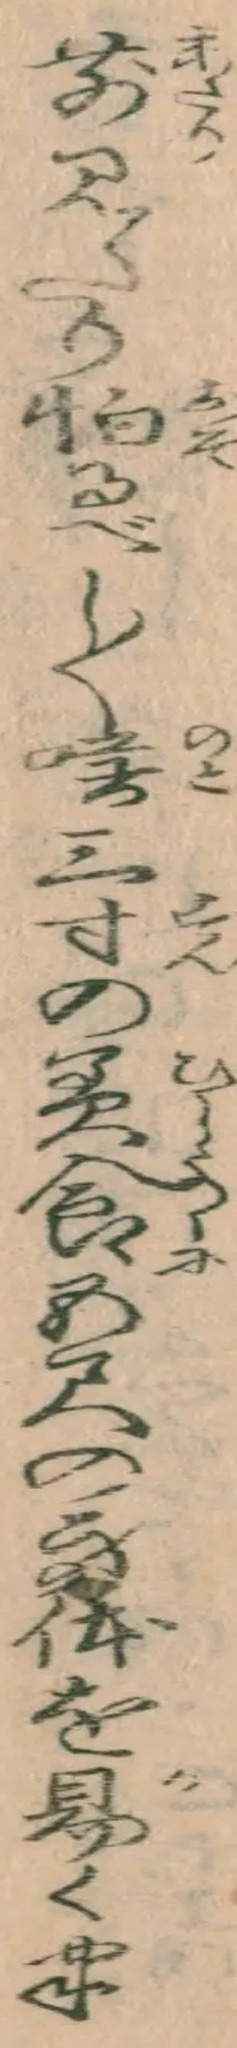前見たり怕るべし〳〵喉三寸の美食五尺の身体を易く半
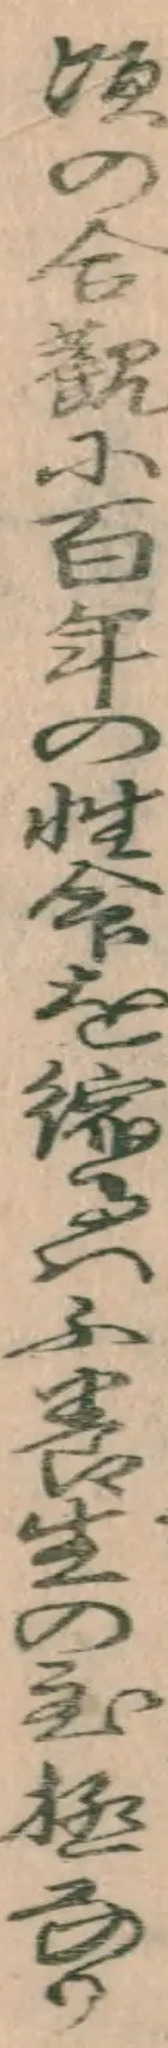頃の合観に百年の性命を縮るは不養生の至極なり
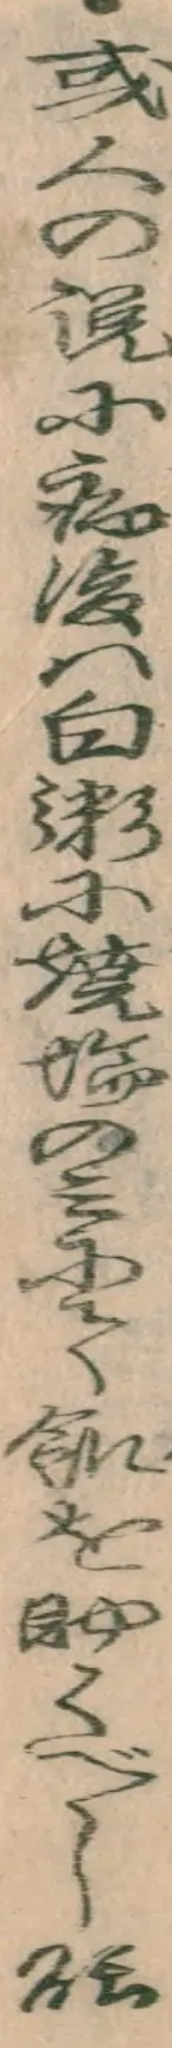・或人の説に病後は白粥に焼塩のみにて飢を助くべし能
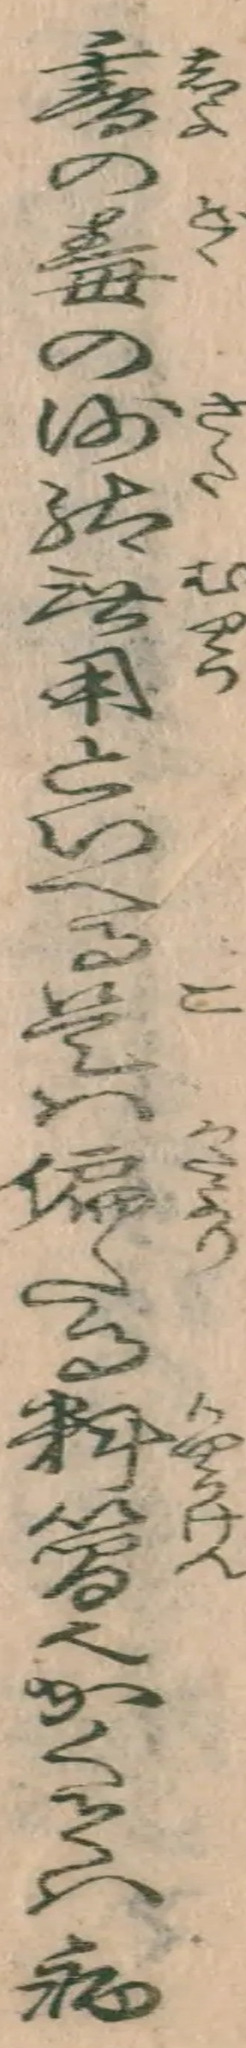書の毒の沙汰無用といへる是は偏たる料簡也かくては病
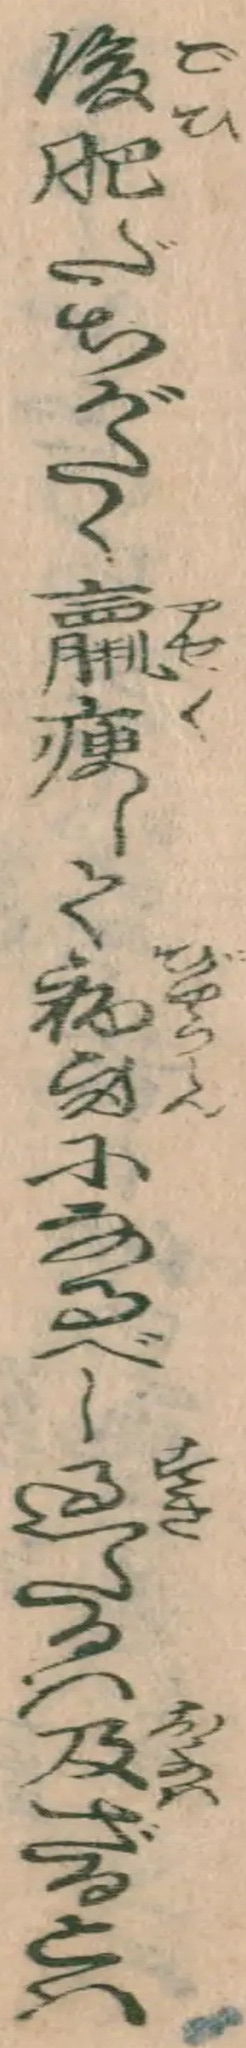後肥だちがたく羸痩して病身になるべし過たるは及ざるとは
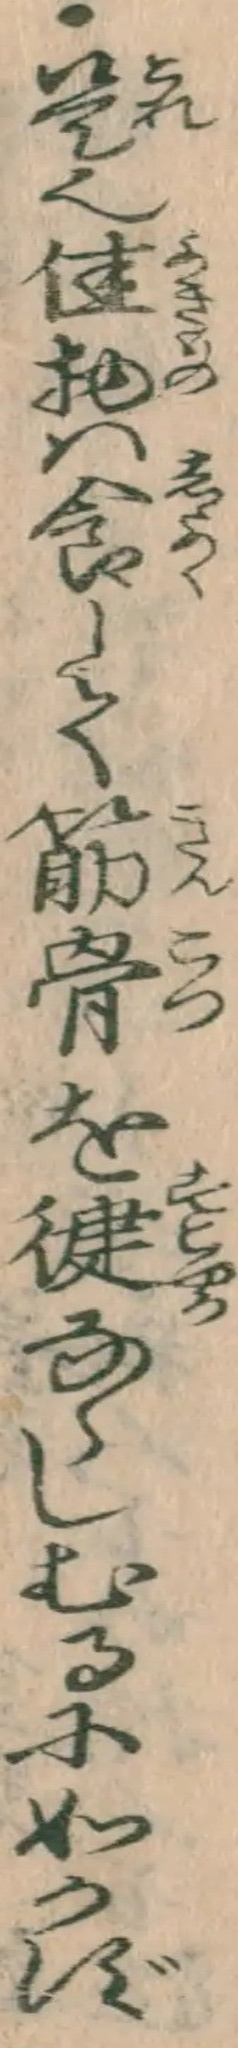・是也佳物は食して筋骨を健ならしむるに如かず
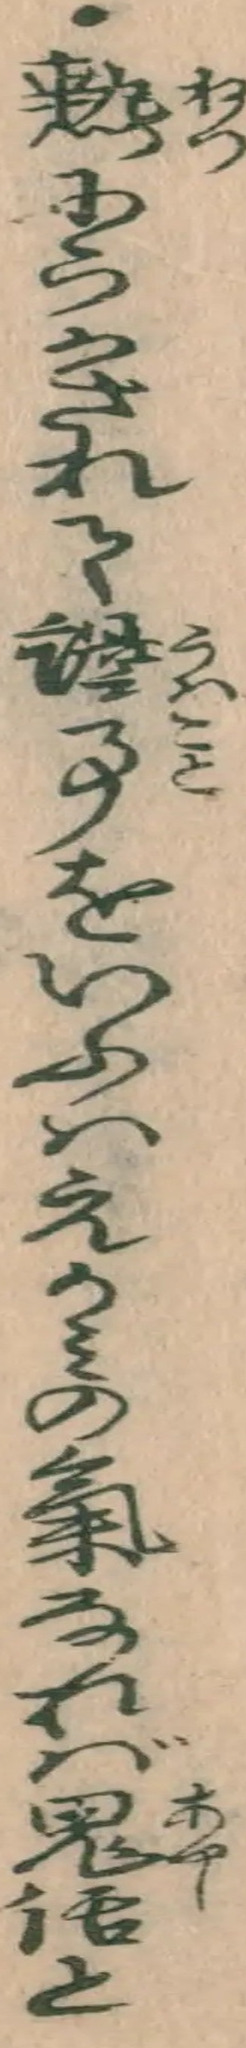・熱にうかされて譫事をいふはえかみの気なれば鬼話と

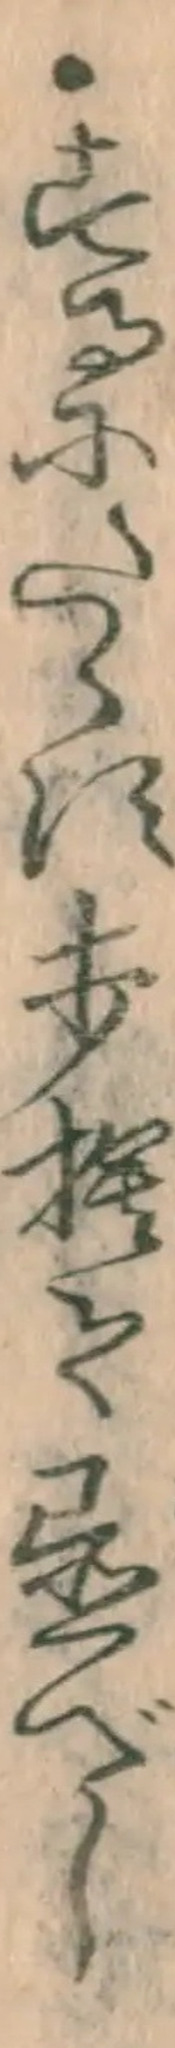・するにたらず打捨て置べし
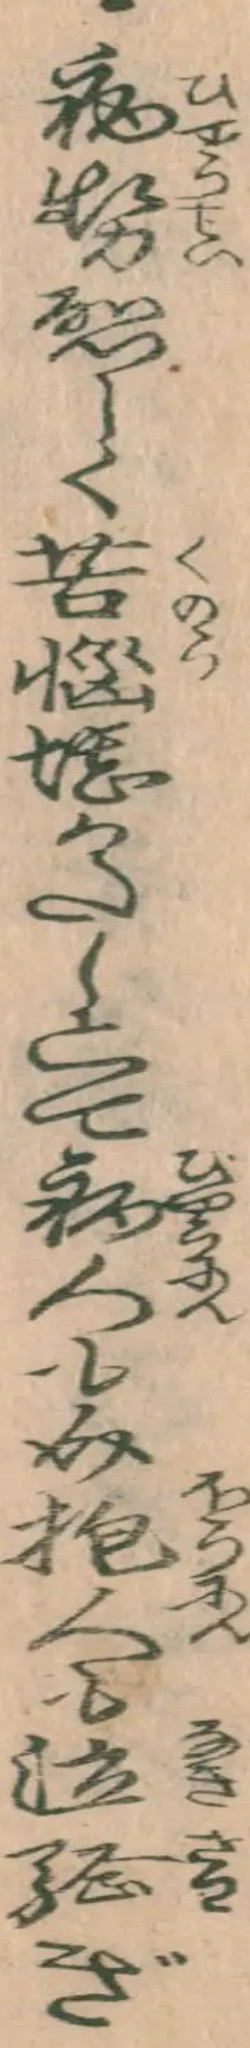・病勢烈しく苦悩堪かたしとて病人も介抱人も泣騒ぎ
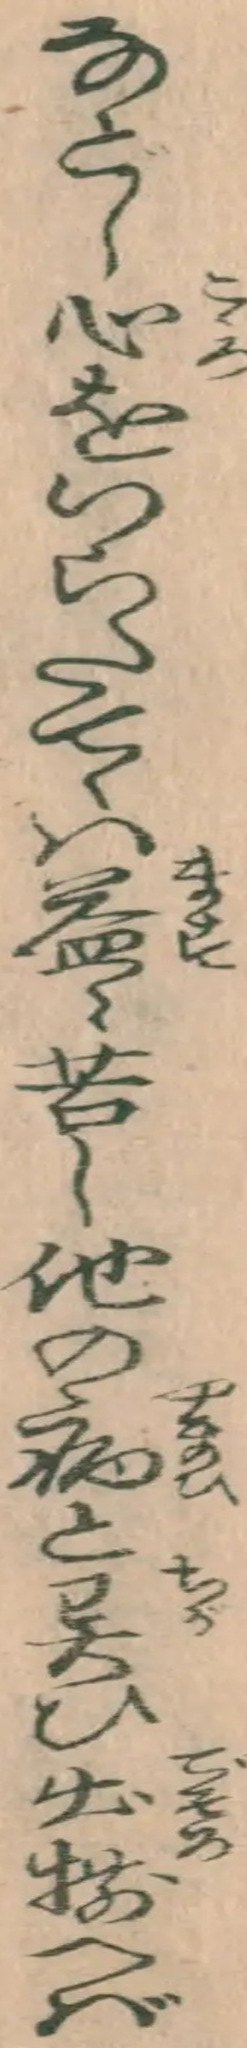などし心をいらたてゝは益々苦し他の病と異ひ出揃へば
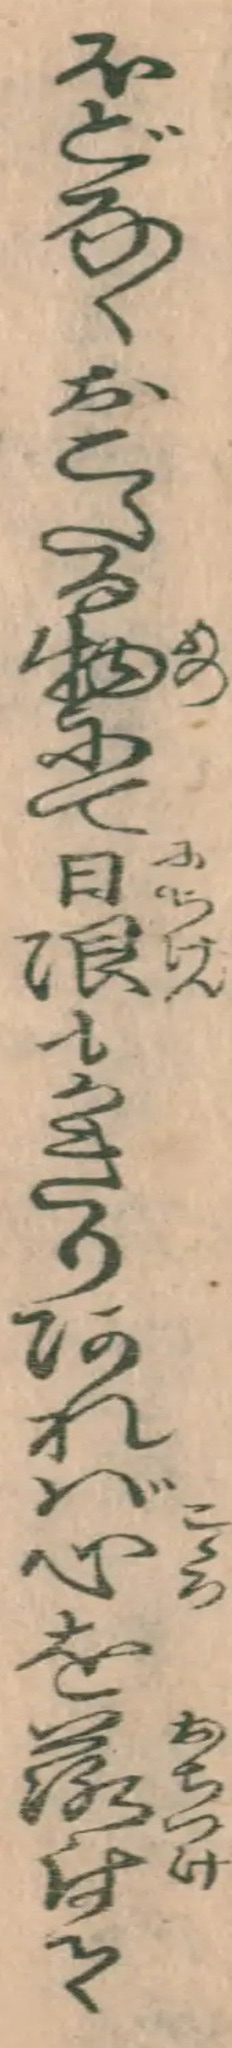ほどなくおこたる物にて日限もかきりあれば心を落付て
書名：麻疹養生鑑
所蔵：国立国会図書館 National Diet Library, JAPAN
